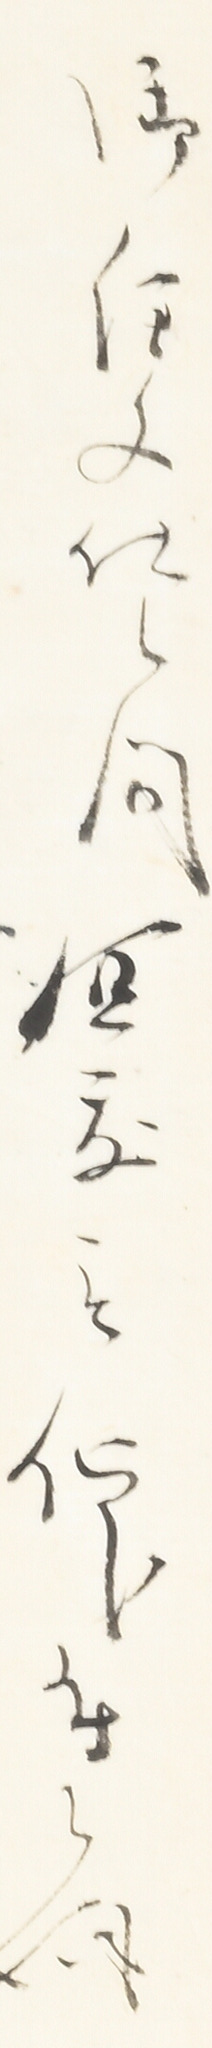御注文仕候間宜敷被仰下候
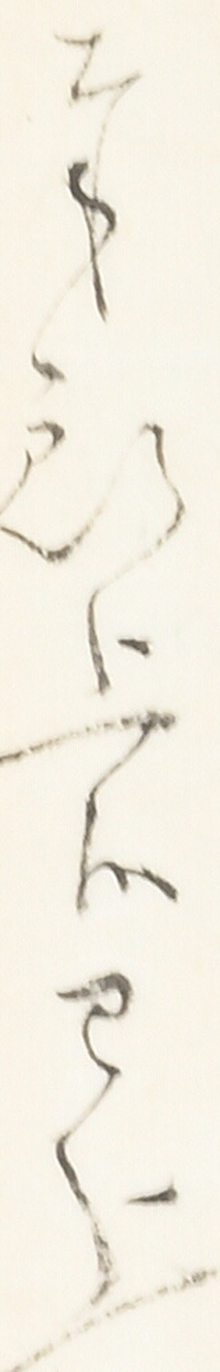奉願上候已上

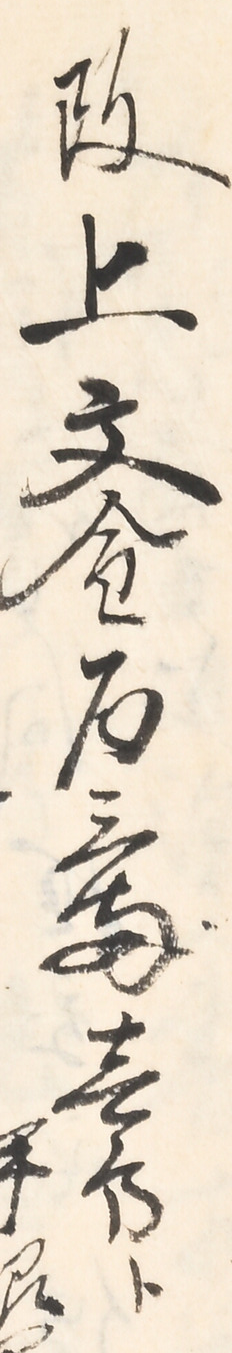改上文金百三両壱分ト
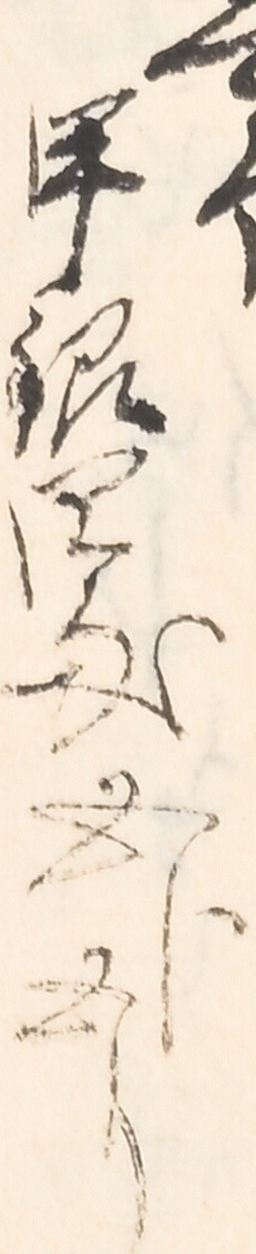甲銀四匁五分五リ
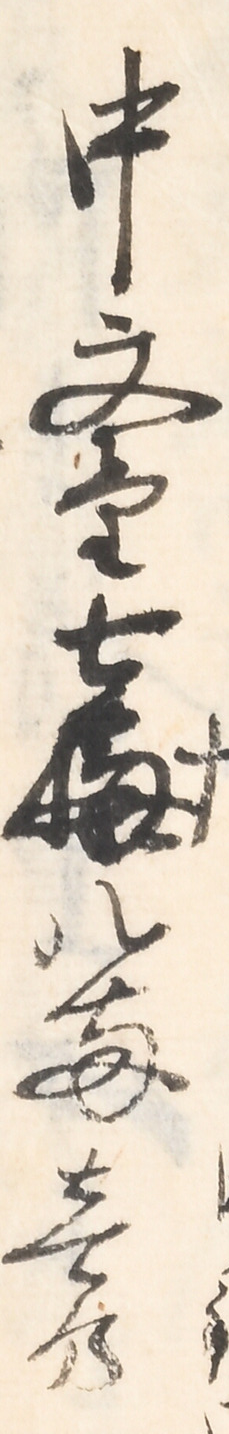中文金七十八両壱分
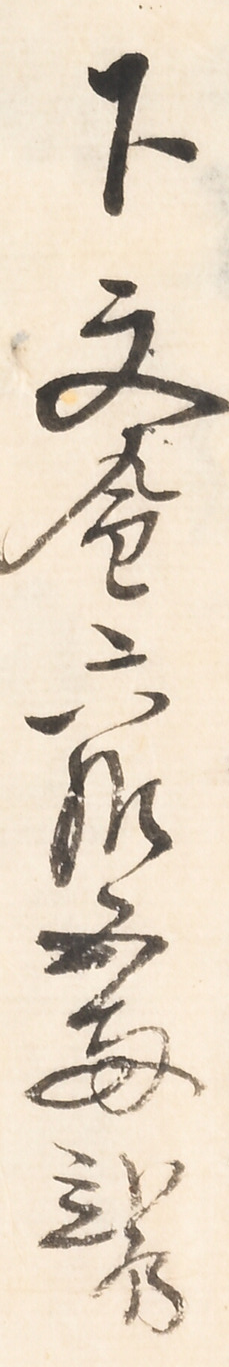下文金六拾五両弐分
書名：天保十歳亥六月日玉垣御注文書上帳
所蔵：伊那市立高遠町図書館・合同会社AMANE
